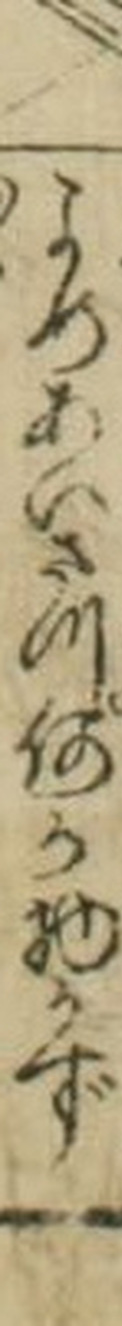よめあいさつ。何か物かず
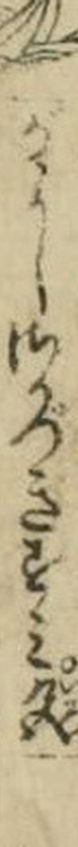がよしさかづきすみ色
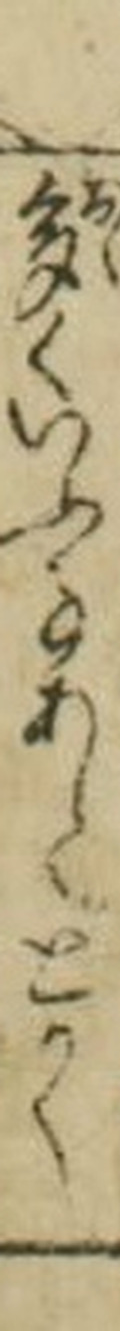多くいふ事あしく。とかく
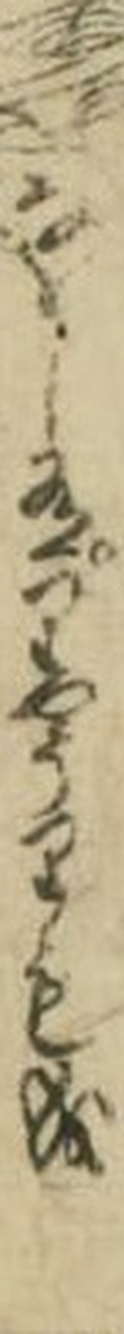なをし有。りやうりも成
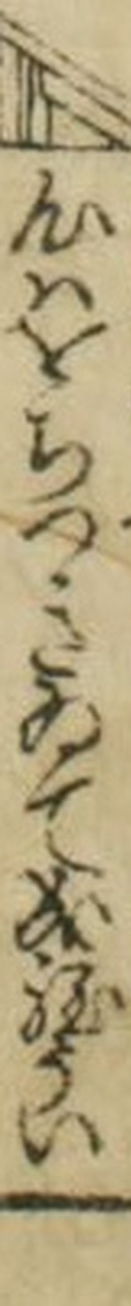心はおちつきゐて成程うい
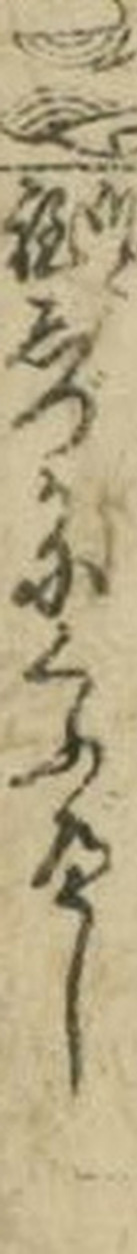程しづかにくふべし
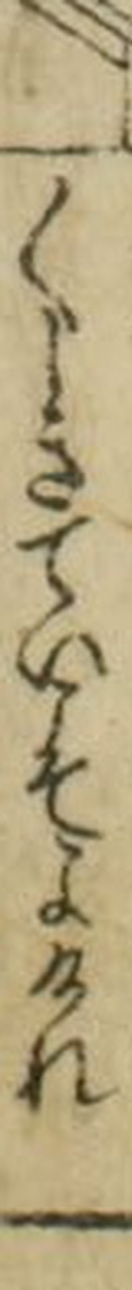〳〵しきていこそよけれ
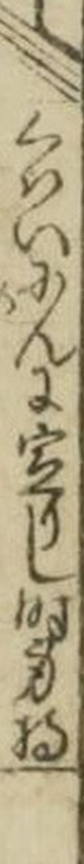くはいにんに定りし時身持
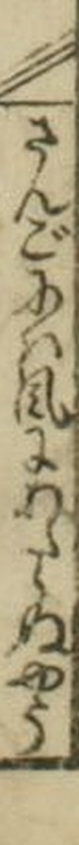さんごには風にあたらぬやう
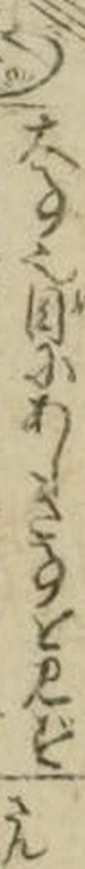大事也目にあしき事を見ず
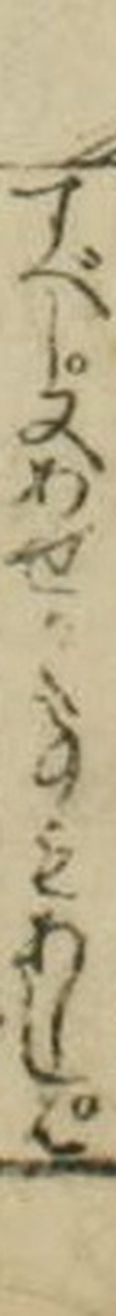すべし。又あせかく事もあしし。は
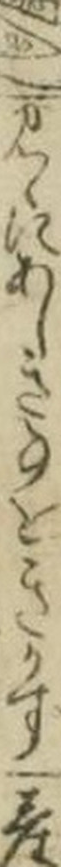みゝにあしき事をきかず
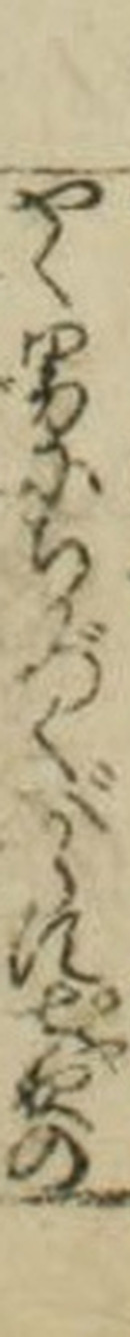やく男にちかづくべからず。七夜の
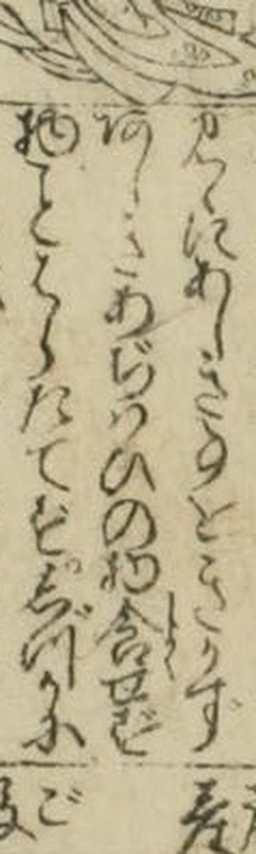あしきあぢはひの物食せず
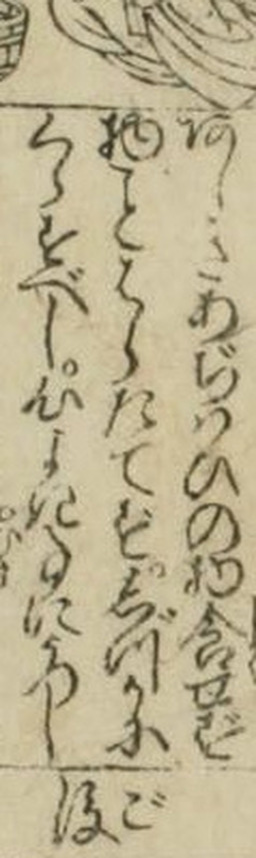物ことはらたてず。しづかに
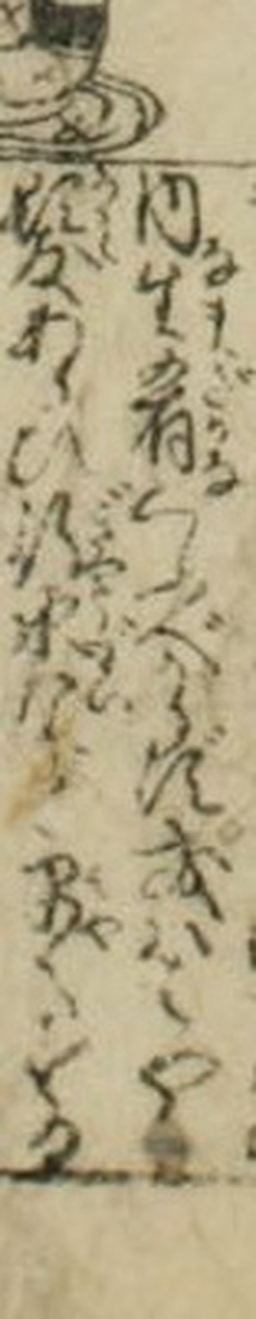髪あらひ行水など早くする
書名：女源氏教訓鑑
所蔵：東京学芸大学附属図書館
